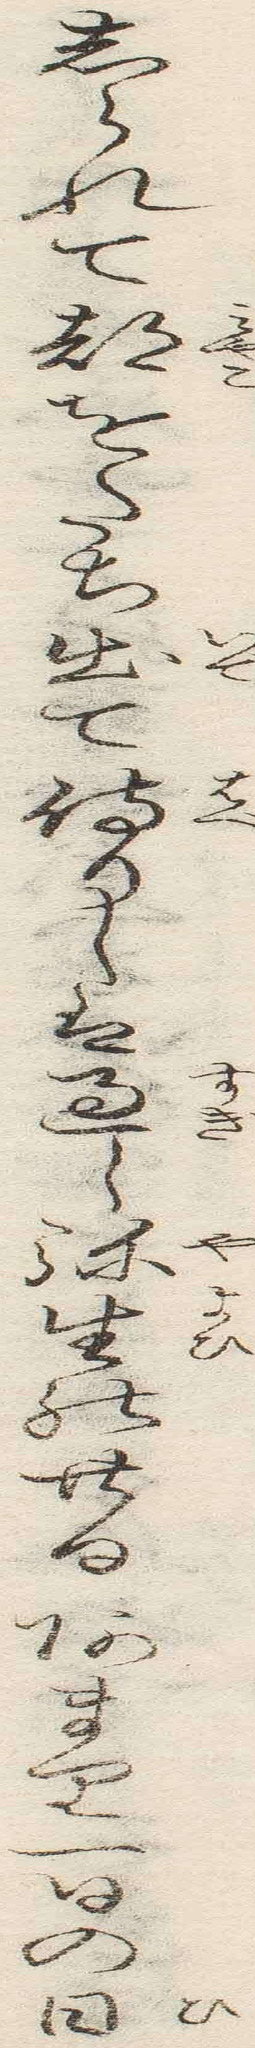しられて都をたち出て侍りしは過し弥生の廿日あまり一日の日
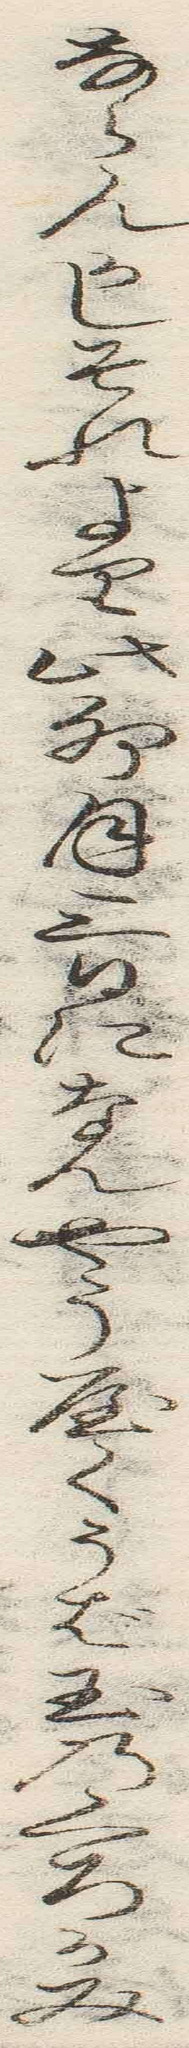ならんかしそれより此夘月三日になんやうやくうば玉のくろかみ
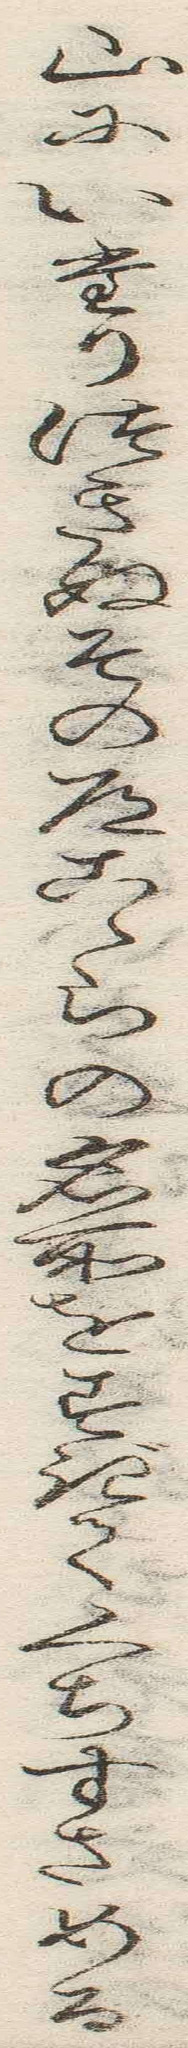山にいたりつきぬその道こゝらの名所をすぎてくちすさめる
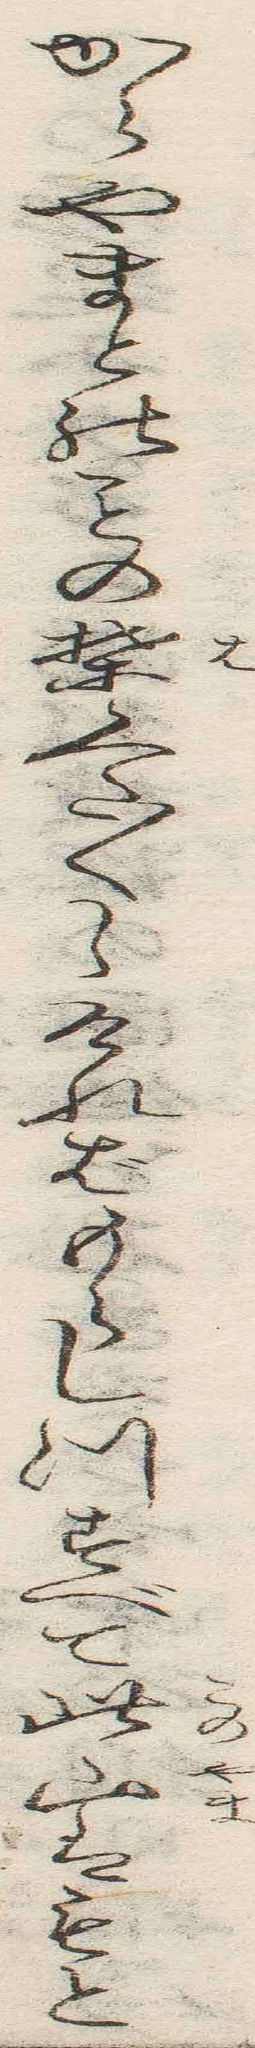からやまとのことの葉くた〳〵しければもらしつすべて此山はもと
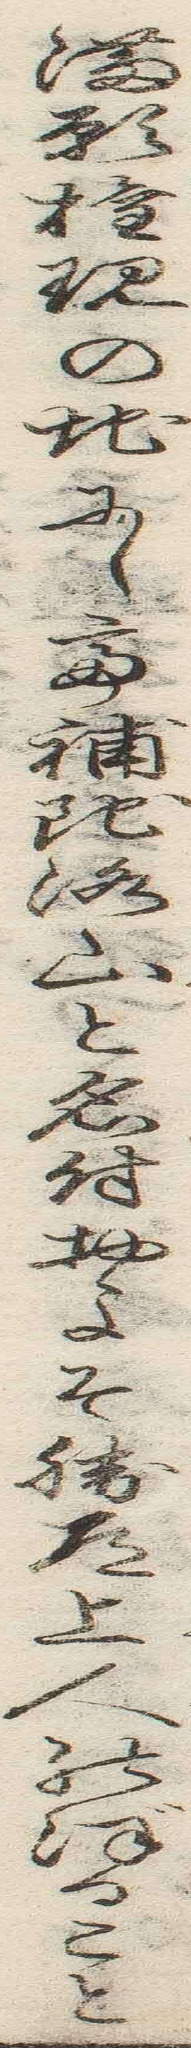満願権現の地にして補陀洛山と名付およそ勝道上人のぼること
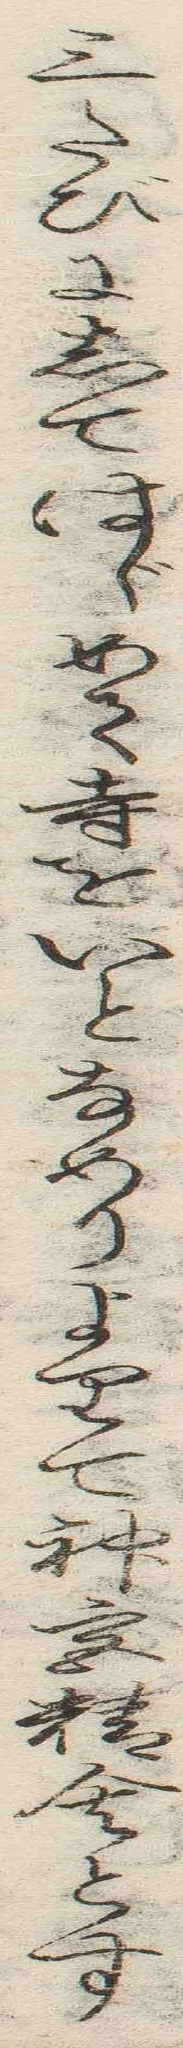三たびにしてはじめて寺をいとなめりよりて神宮精舎とす
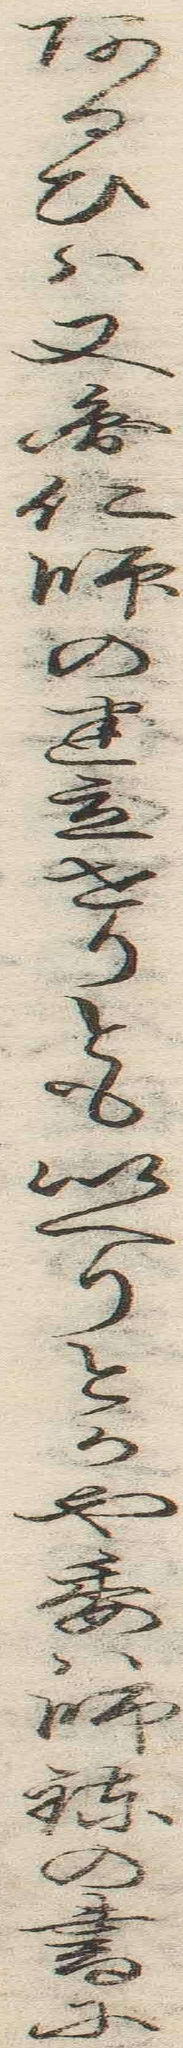あるひは又圓仁師の建立せりともいへりとかや委は師錬の書に

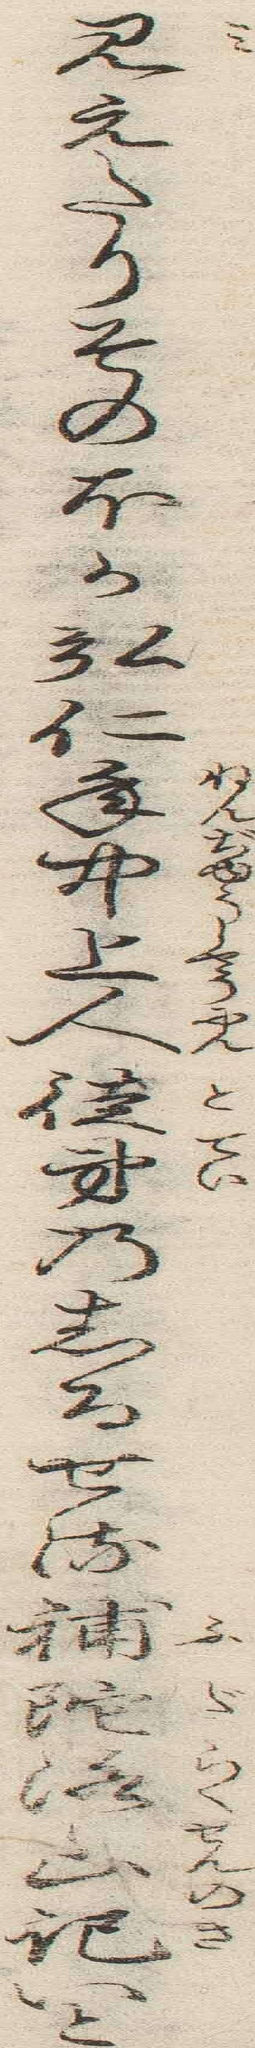見えたりそのほか弘仁年中上人徒㐧のしるせる補陀洛山記いと
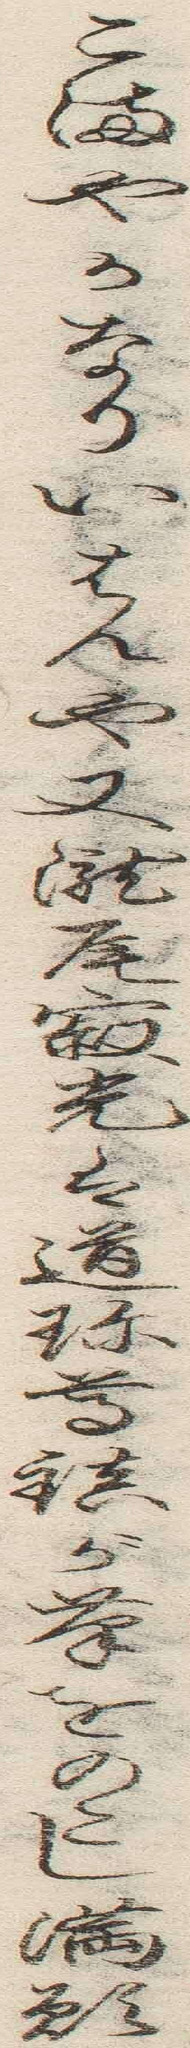こまやかなりいはんや又瀧尾寂光は道珎尊鎮が筆をのこし満願
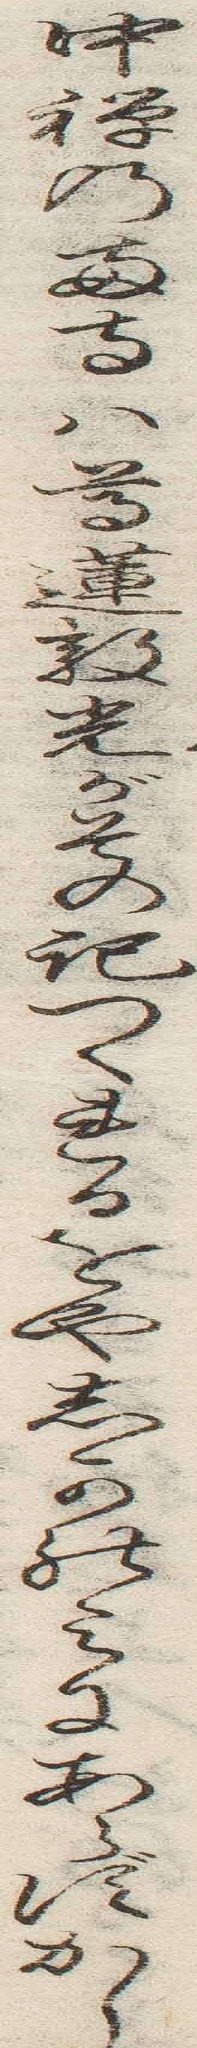中禅の両寺は尊蓮敦光がその記つくれるをやしかのみにあらずかし
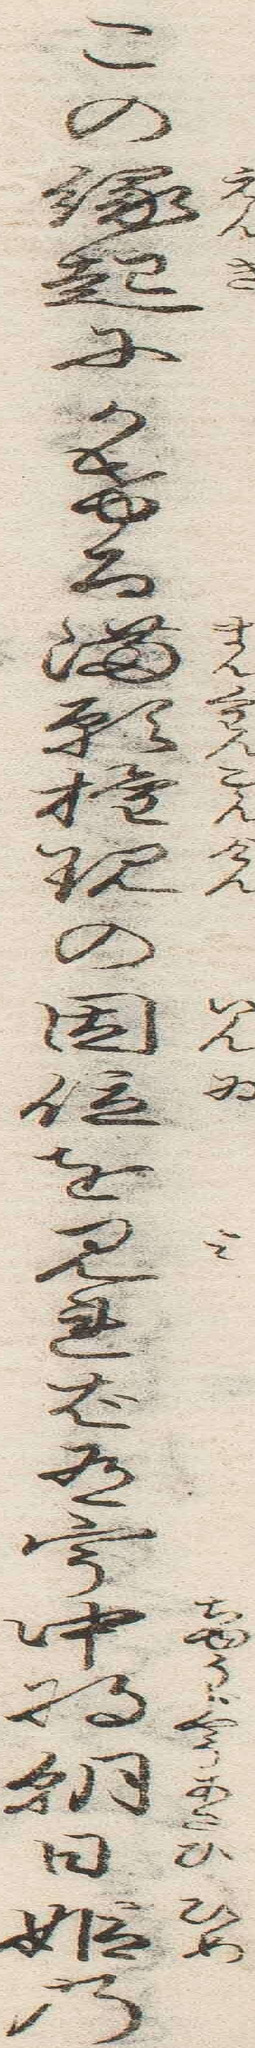この縁起にかける満願權現の因位を見れば有宇中将朝日姫の
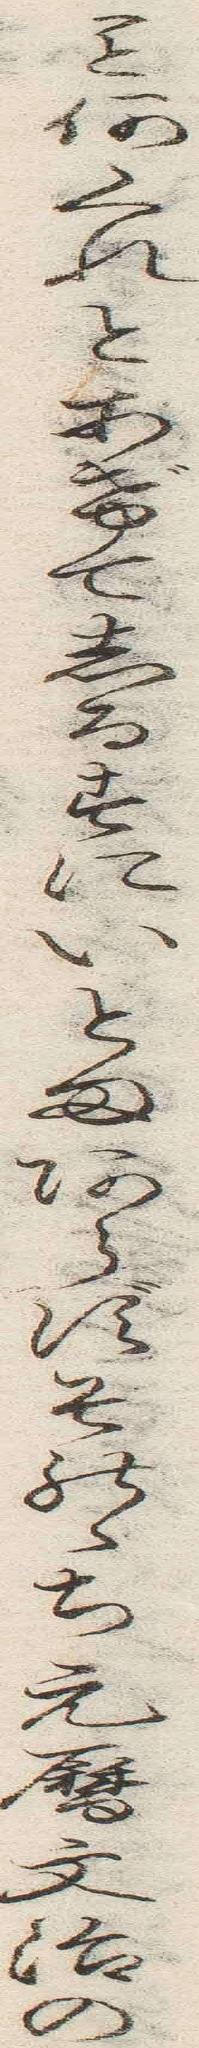こと何くれとあげてしるすにいとまあらずそのゝち元歷文治の
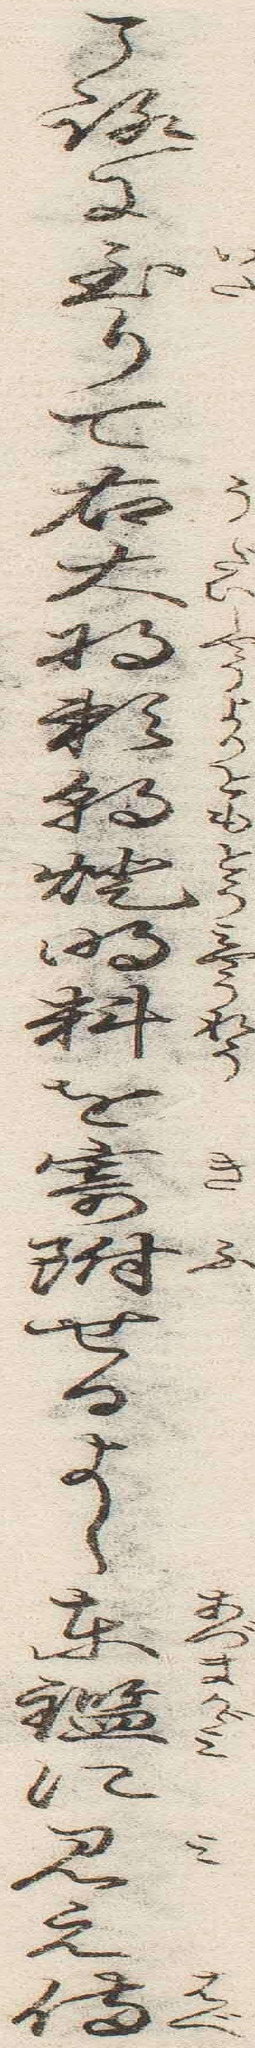ころに至りて右大将頼朝燈明料を寄附せるよし東鑑に見え侍
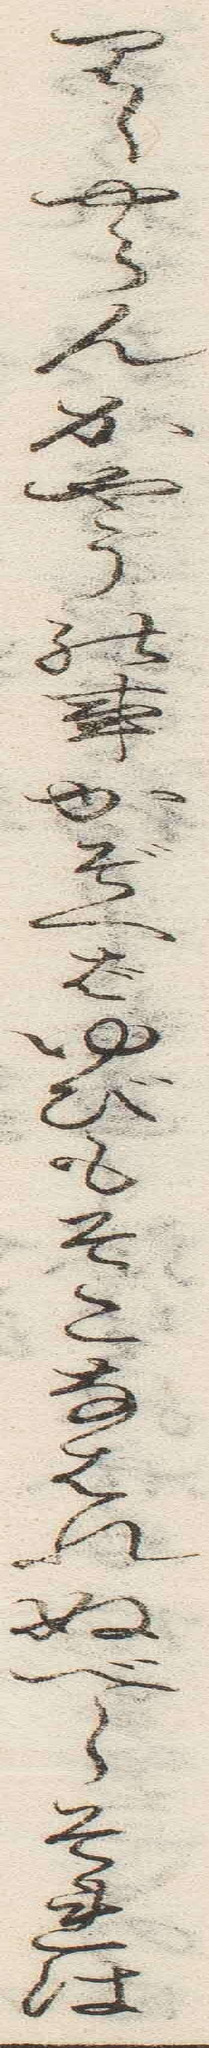りしやらんかやうの事かぞへばゆびもそこなはれぬべしそれは
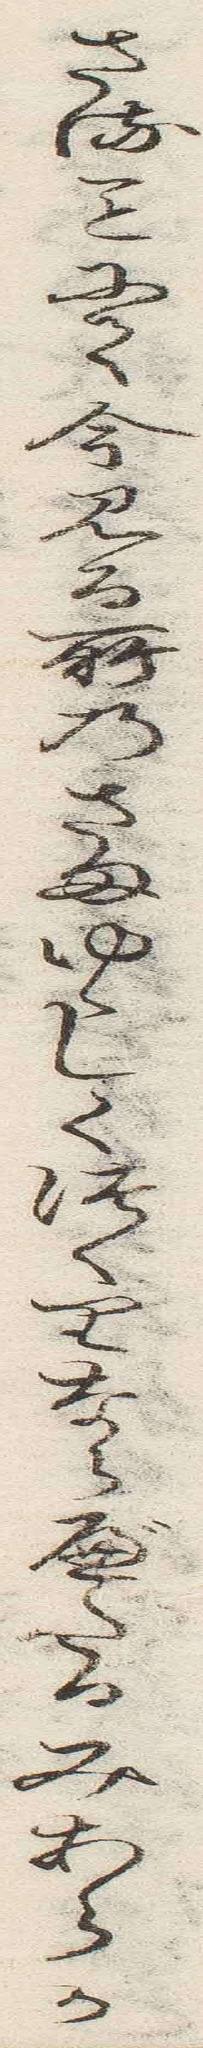さることにて今見る所のさまゆゝしくつくりならべたるみあらか
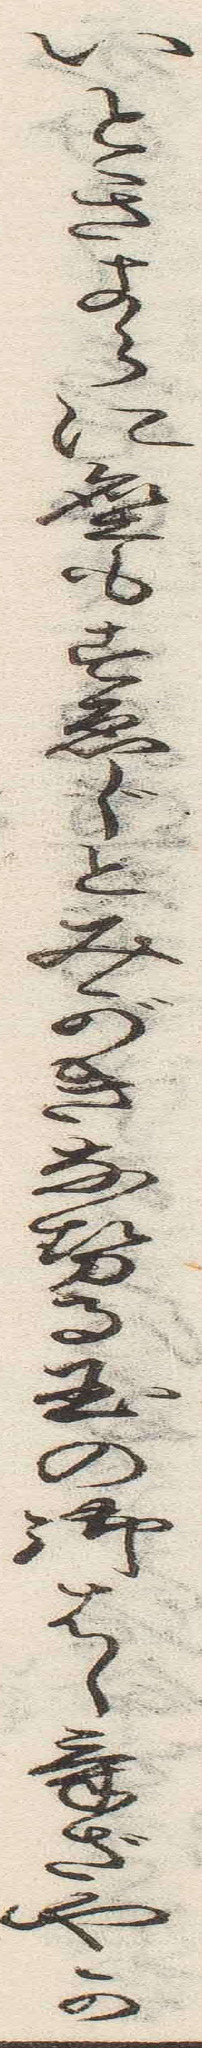いときよらに塵もすゑじとみがきなせる玉の御はしけざやか
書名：日光山志
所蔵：東京学芸大学附属図書館 国文学研究資料館
